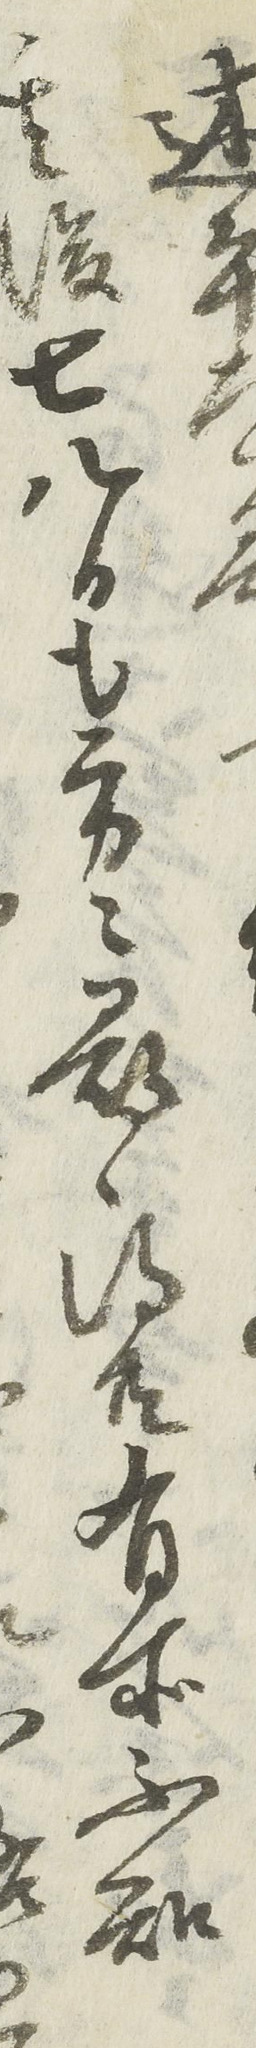其後七八日も方々尋候得共有所不知
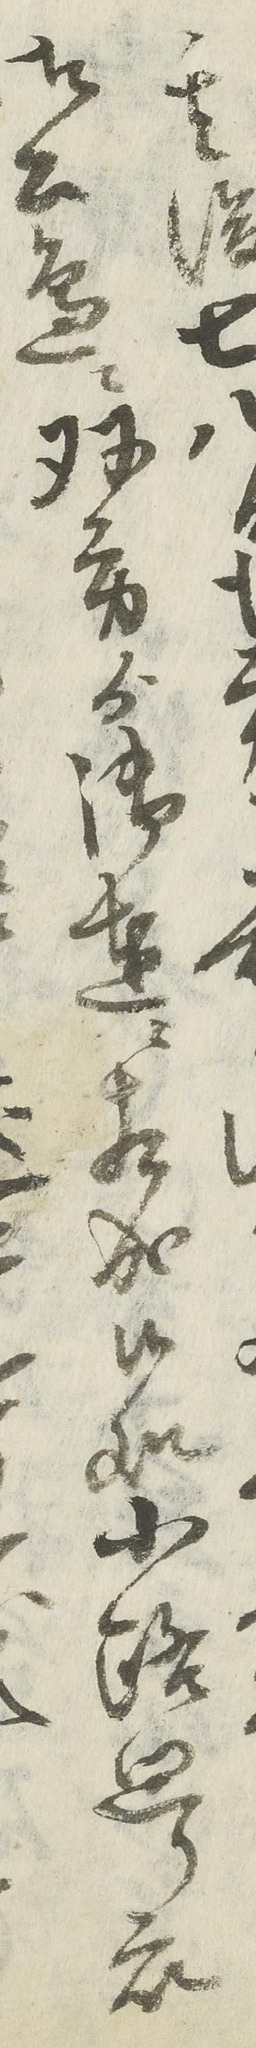御公辺ニ双方ゟ御達ニ相成候処小路廻り衆
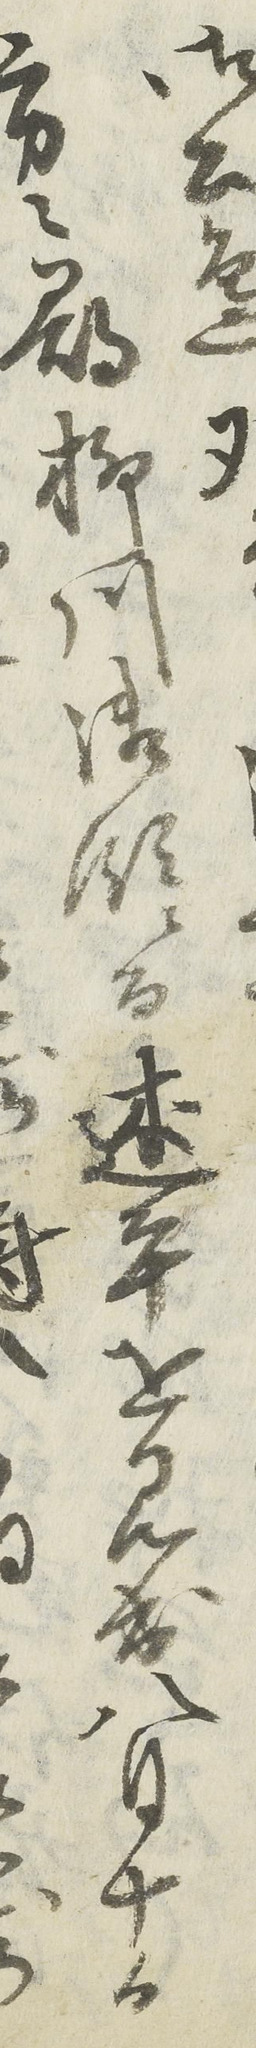方々尋柳川御領ニ而述平を見出八月十日
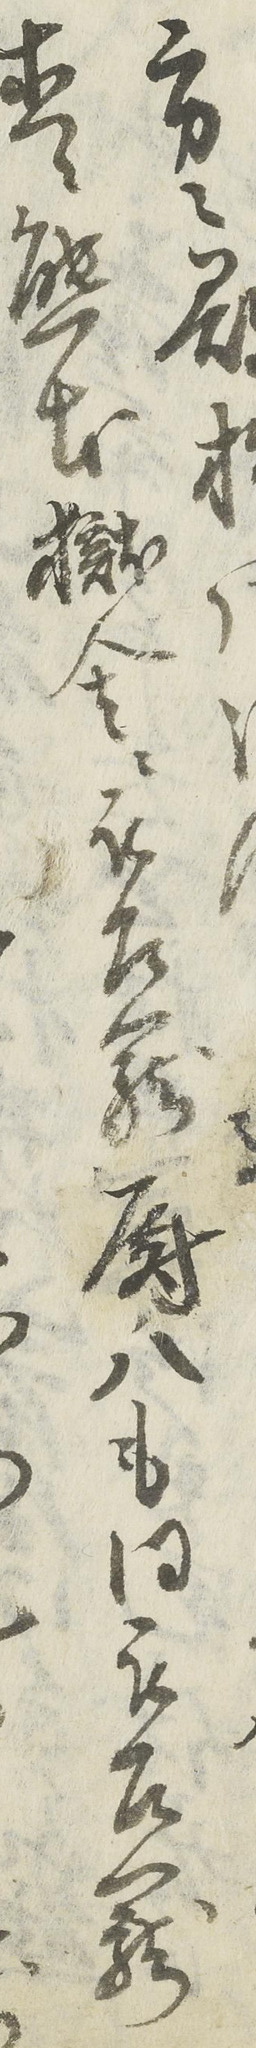直々熊本獄舎ニ被召寵厨八も同被召寵
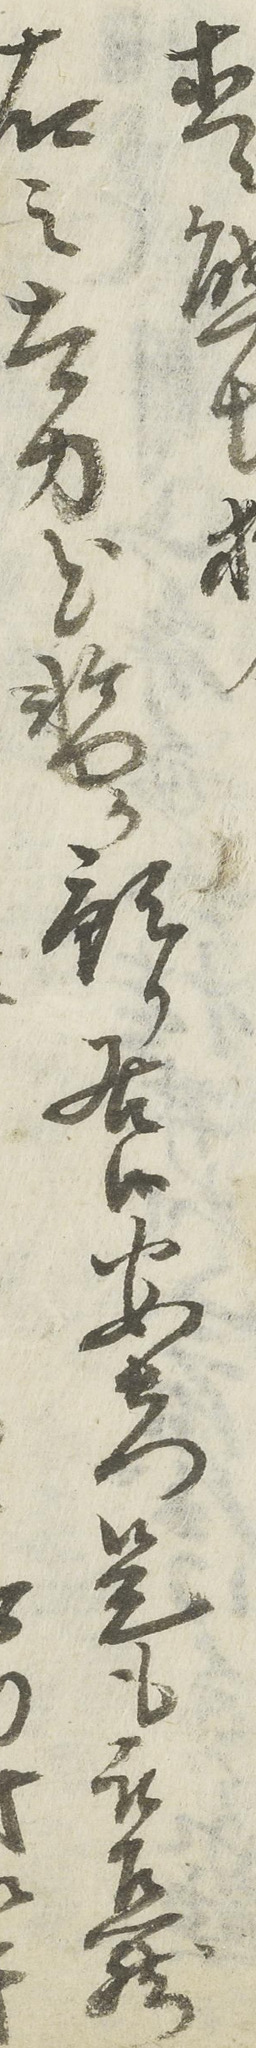右の太刀を暫ク預り居候安右衛門是も被召寵
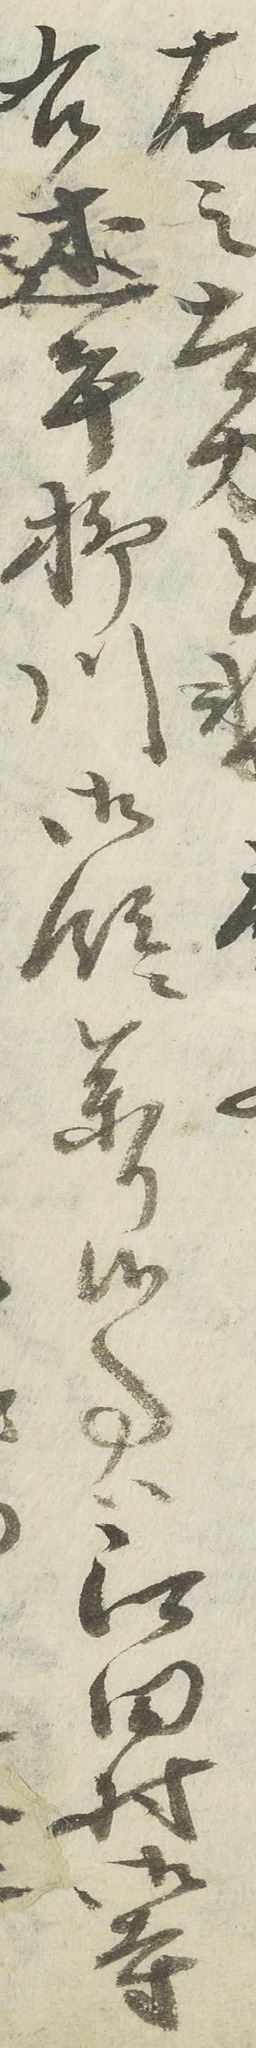右述平柳川御領ニ参り候事は江田村御寺
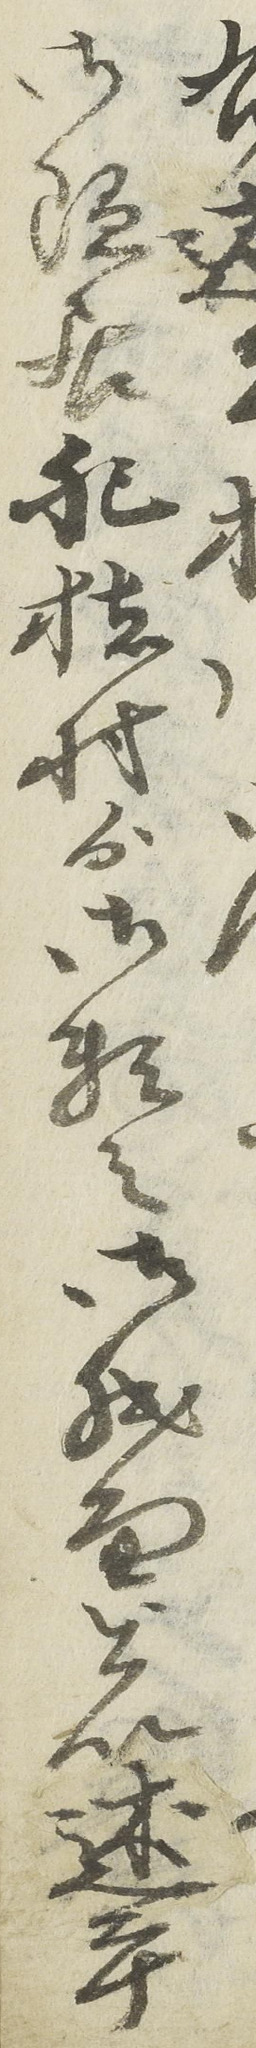御隠居肥猪村ゟ御頼之御紙面を以述平

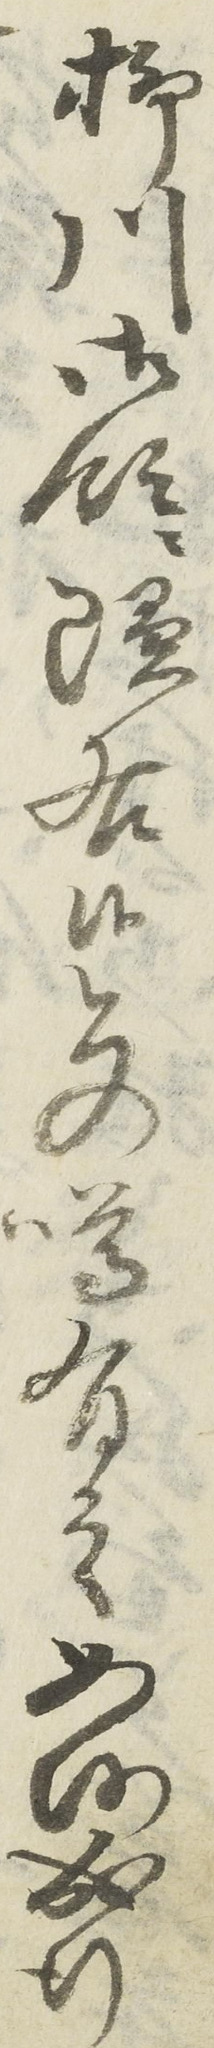柳川御領ニ隠居候との噂有之如何成行
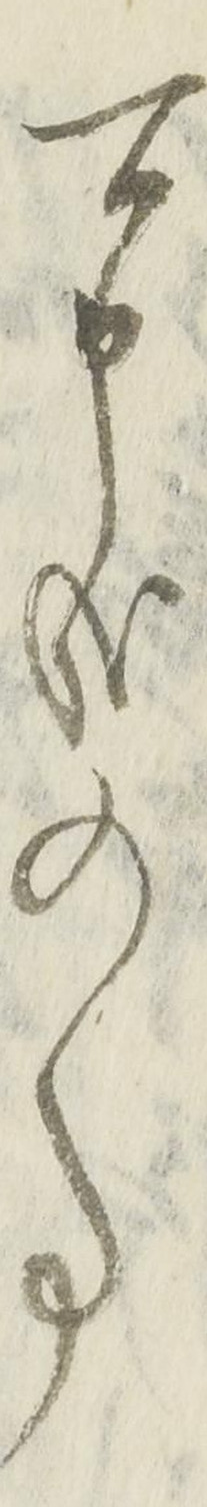可申哉の事
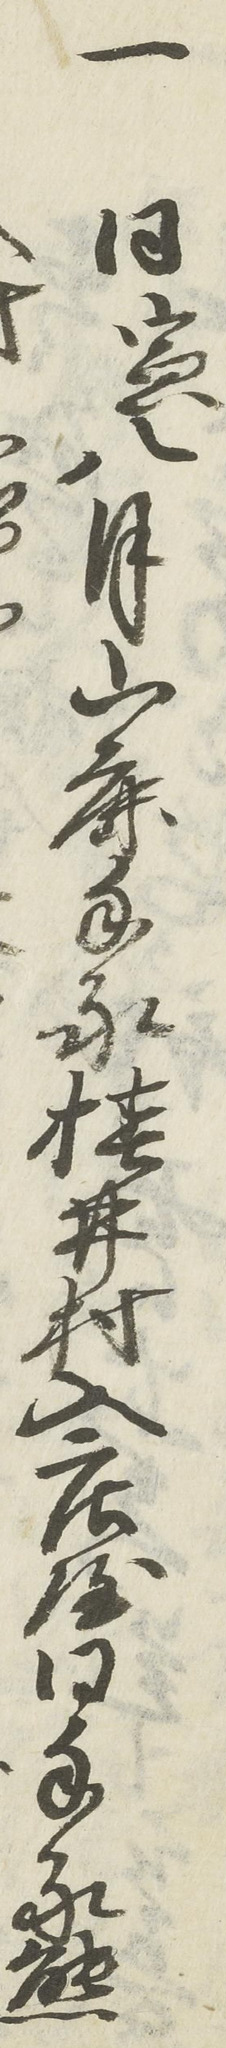一同寅八月山鹿手永桂井村入庄屋同手永熊
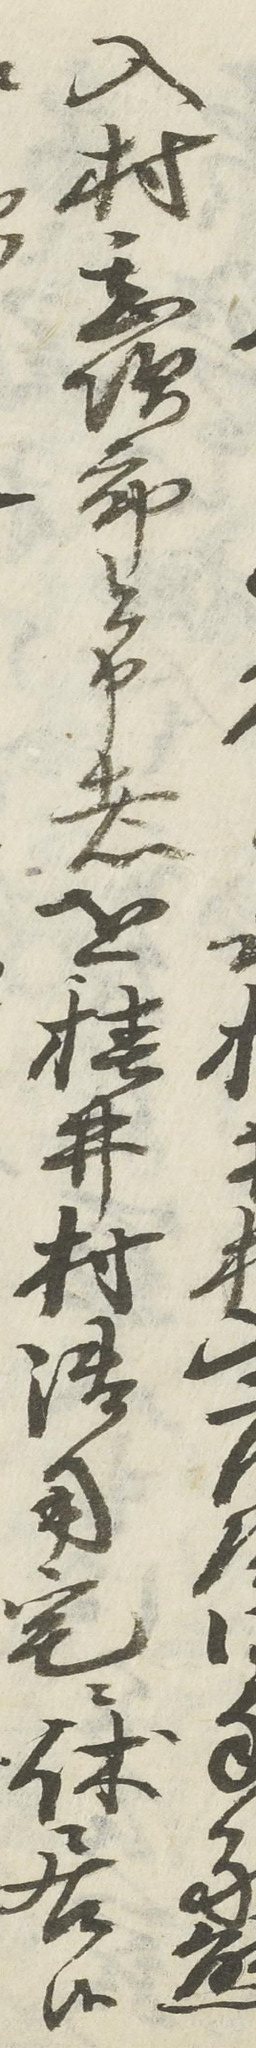入村甚次郎と申者を桂井村御用宅ニ休居候
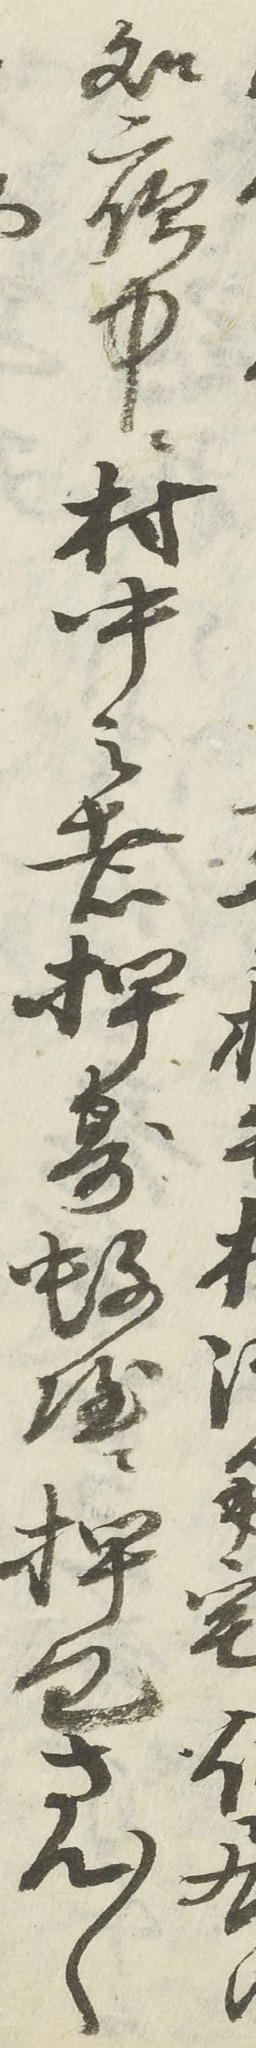処夜中ニ村中之者押寄蚊屋ニ押包さん〳〵
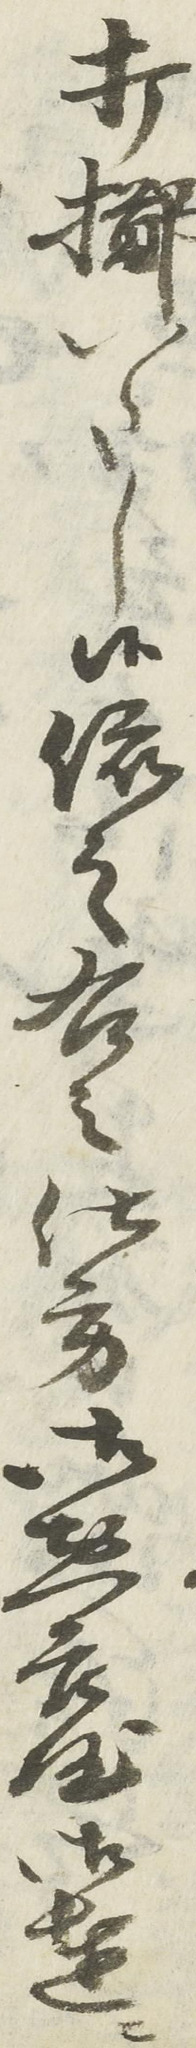打擲いたし候依之右之仕方御惣庄屋御達ニ
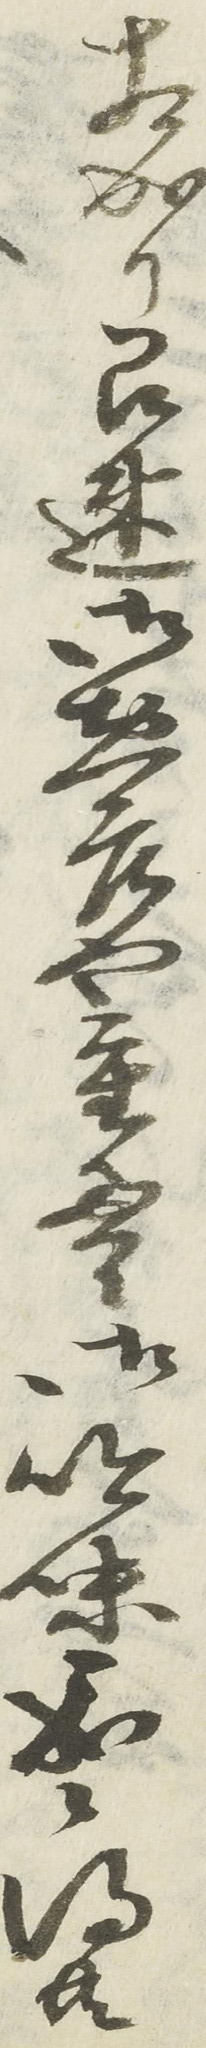相成り即速御惣庄や重畳御吟味成候得共
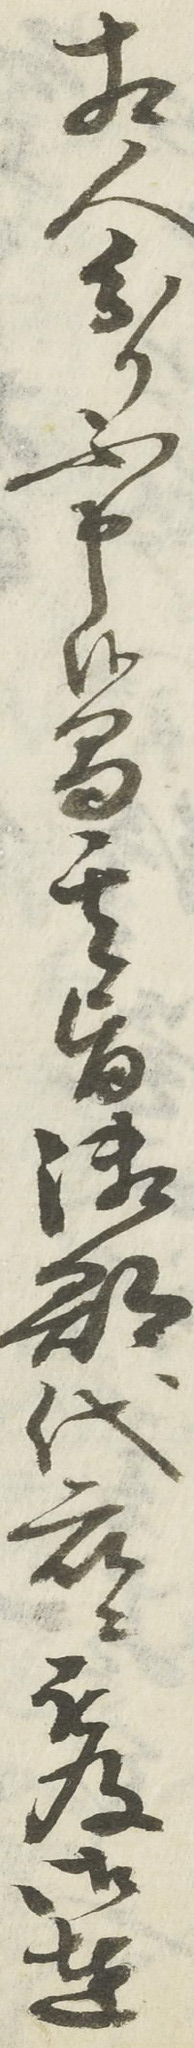相人分り不申候間其旨御郡代衆ニ被及御達
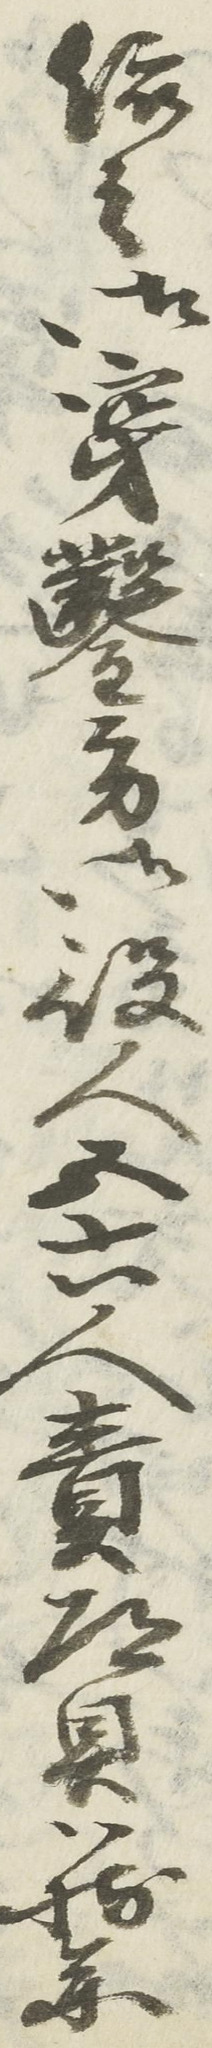依之御穿鑿方御役人五六人責道具は持参
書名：後見笑
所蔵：東京大学地震研究所図書室 Earthquake Research Institute Library, The University of Tokyo, JAPAN
